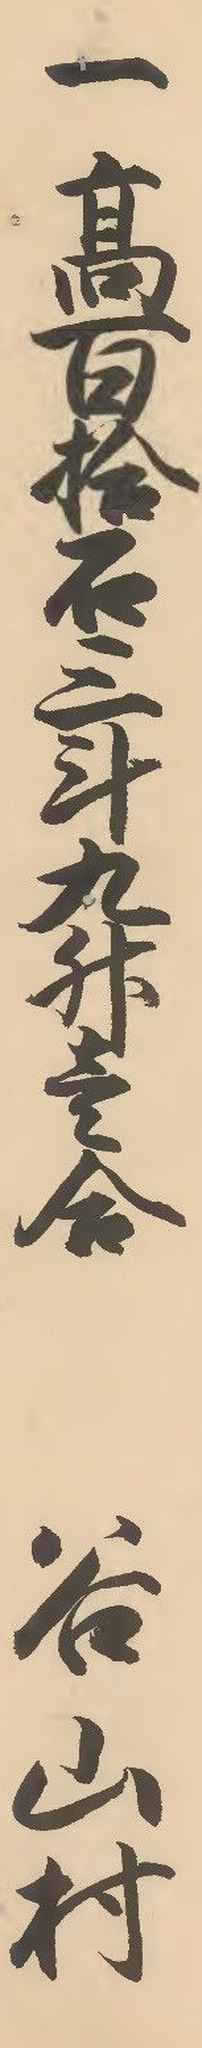一高百拾石三斗九升壱合谷山村

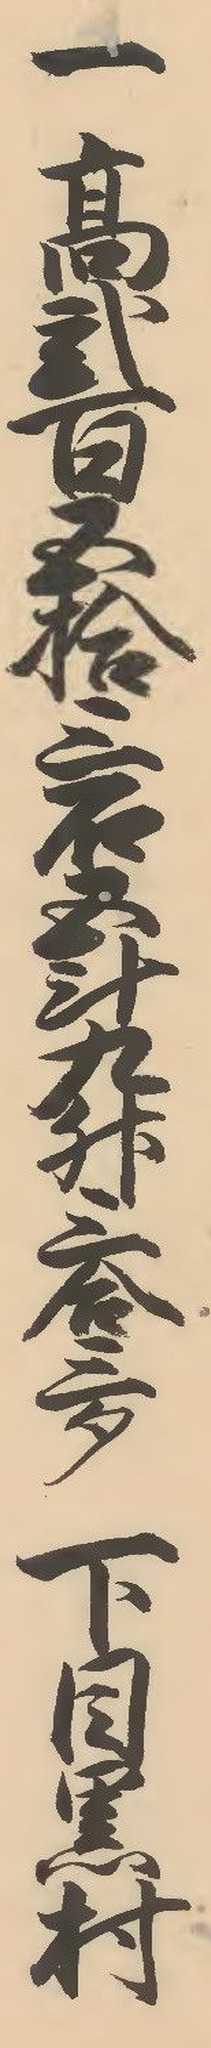一高弐百五拾三石五斗九升三合三勺下目黒村
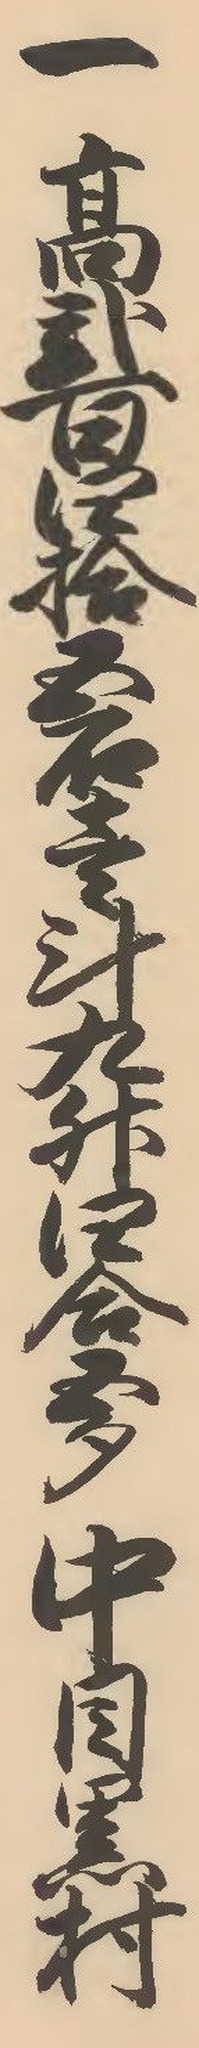一高弐百四拾五石壱斗九升四合五勺中目黒村
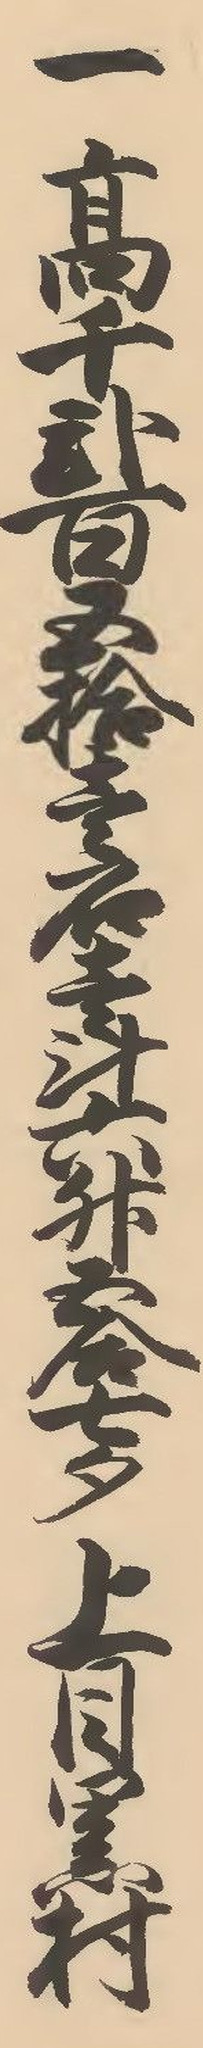一高千弐百五拾壱石壱斗六升五合七勺上目黒村
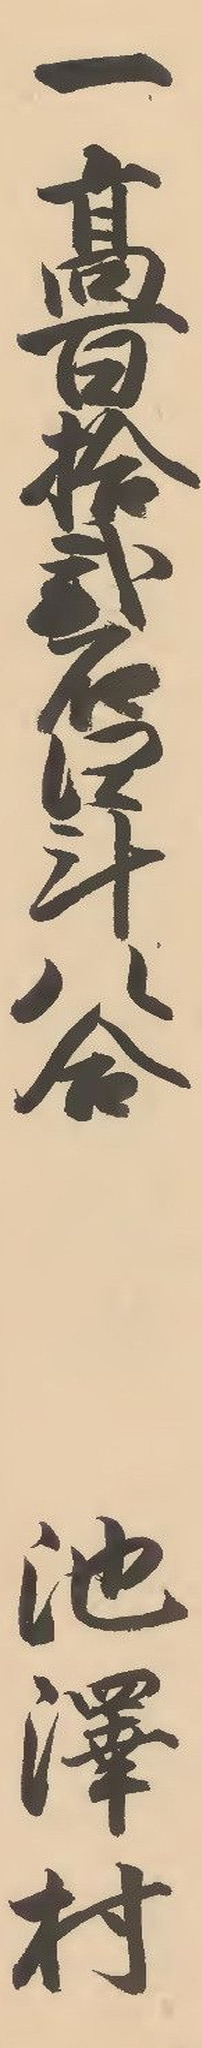一高百拾弐石四斗八合池澤村
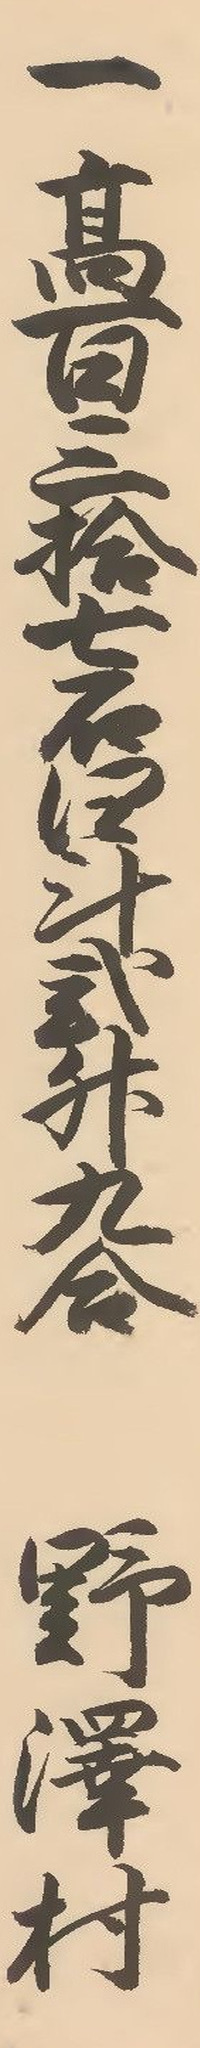一高百三拾七石四斗弐升九合野澤村
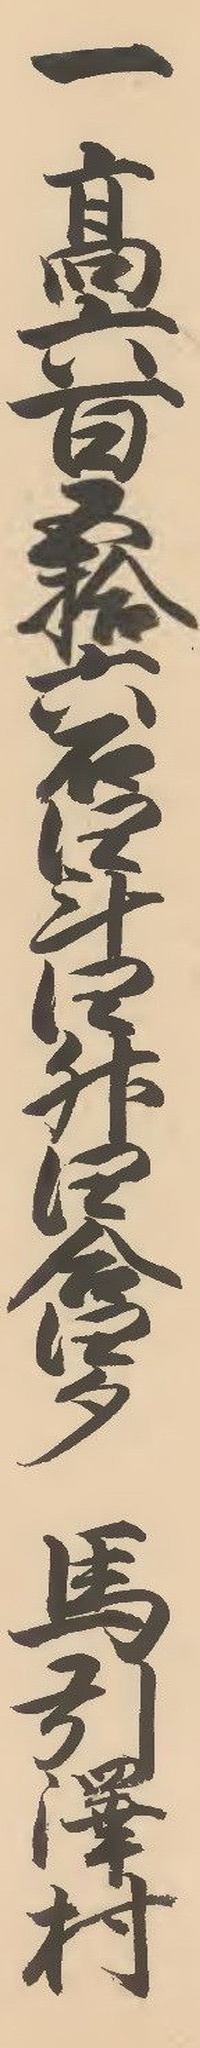一高六百五拾六石四斗四升四合四勺馬引澤村
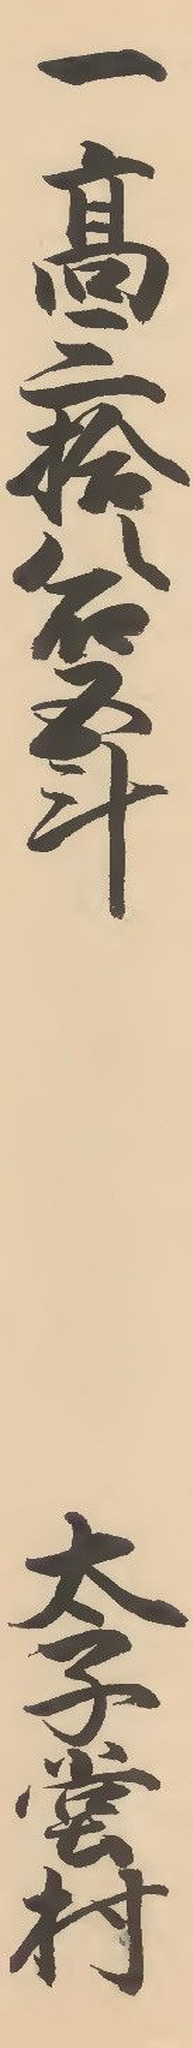一高三拾八石五斗太子堂村
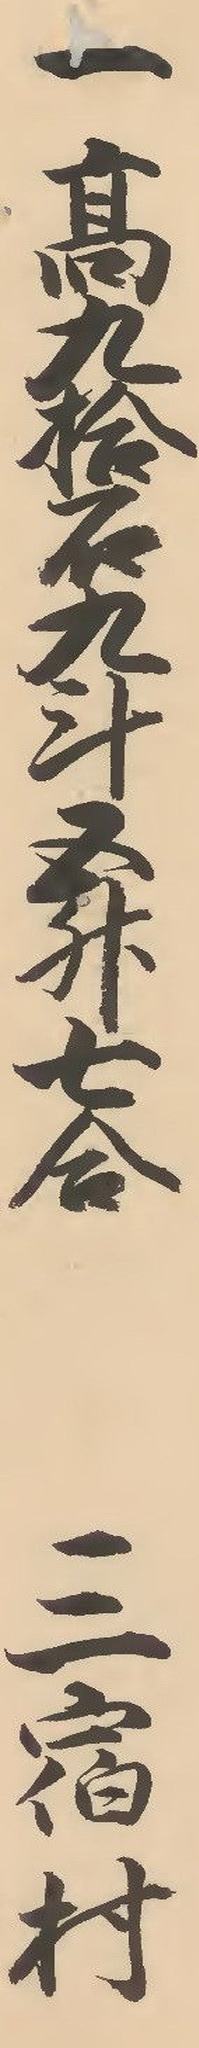一高九拾石九斗五升七合三宿村

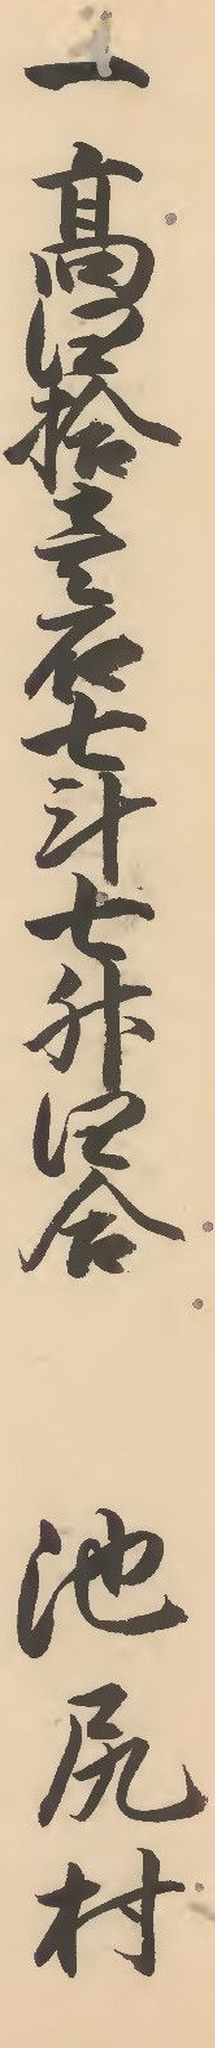一高四拾壱石七斗七升四合池尻村
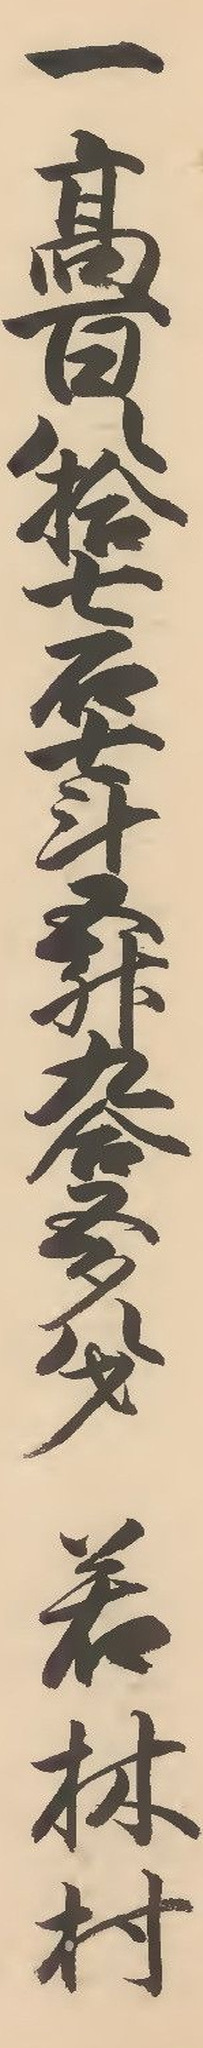一高百八拾七石七斗五升九合五勺八才若林村
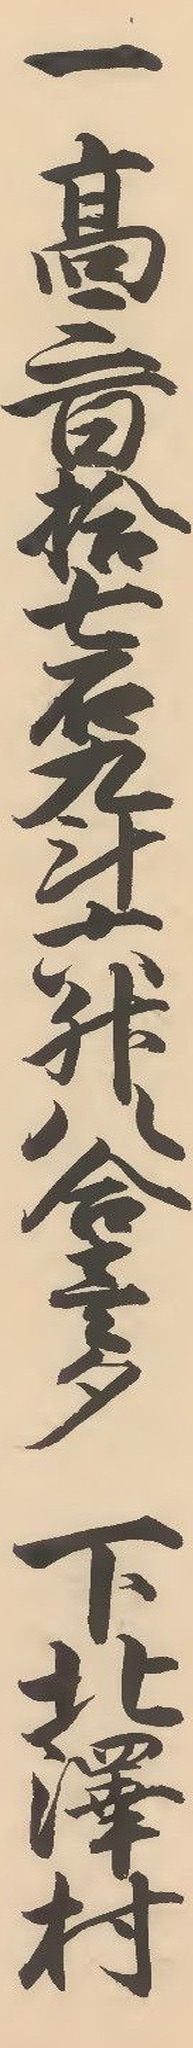一高三百拾七石九斗六升八合壱勺下北澤村
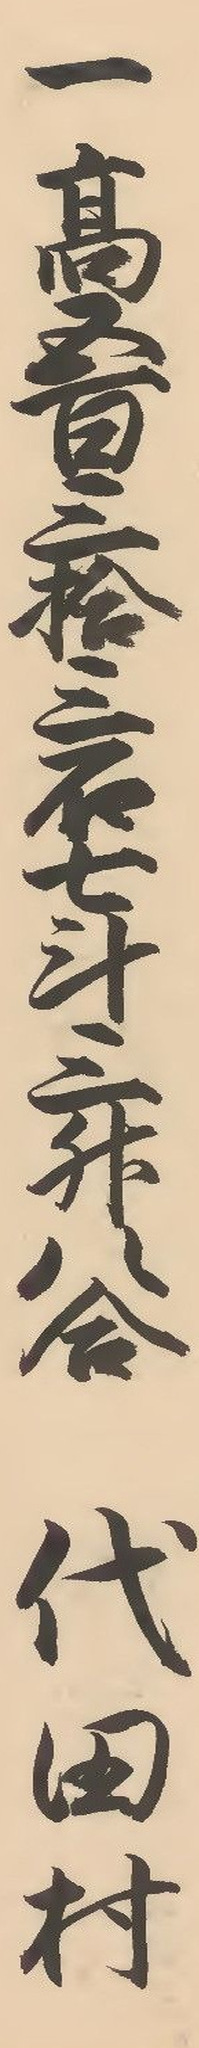一高五百三拾三石七斗三升八合代田村
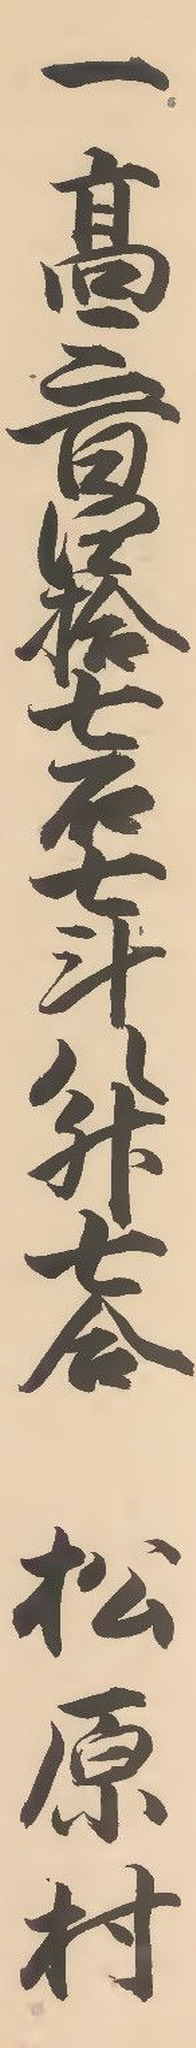一高三百四拾七石七斗八升七合松原村
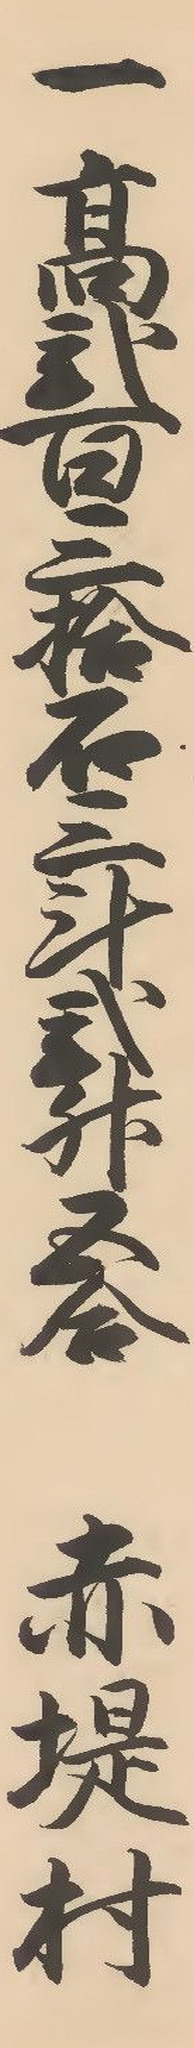一高弐百三拾石三斗弐升五合赤提村
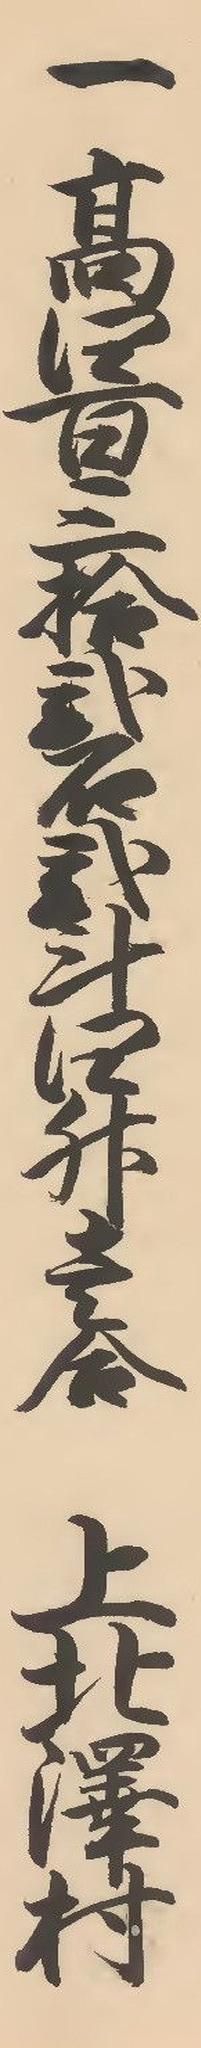一高四百三拾弐石弐斗四升壱合上北澤村
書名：武蔵国郷帳　上
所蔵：国立公文書館 National Archives of Japan
